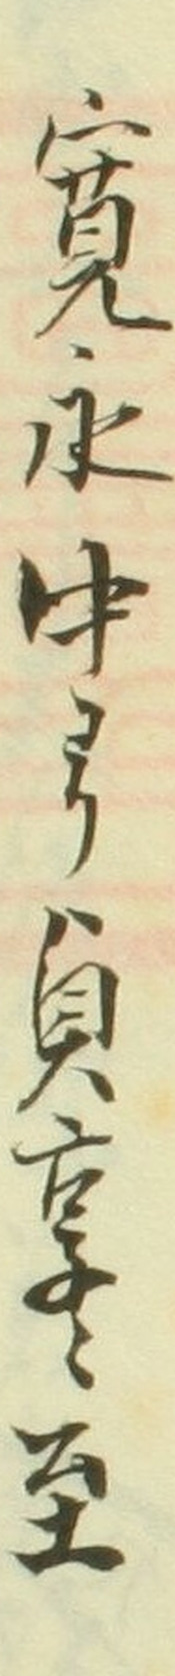寛永中ヨリ貞享ニ至
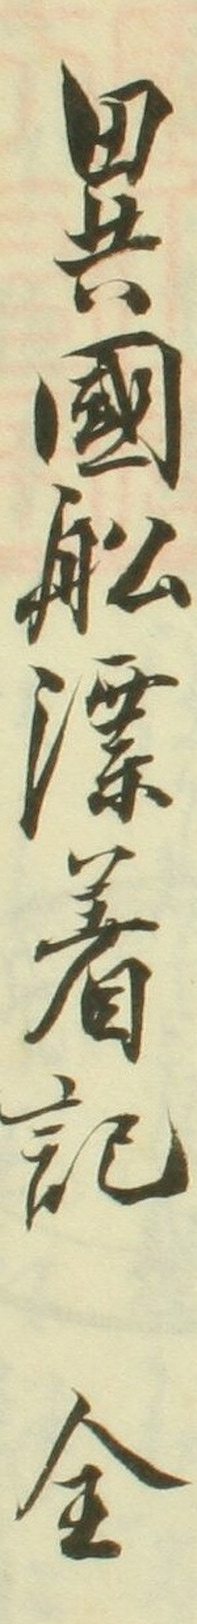異国船漂着記

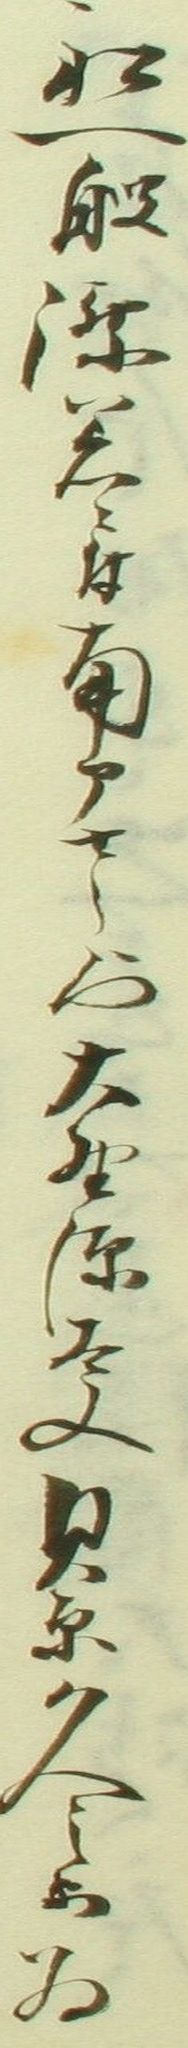船一艘漂着に付南部七郎右衛門大野源太夫貝原久兵衛為
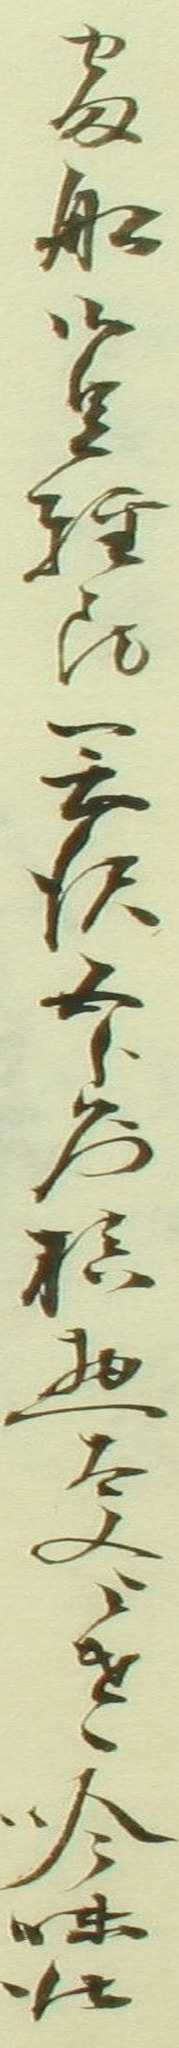番船御足軽頭谷沢五郎左衛門槙惣太夫被遣候吟味仕
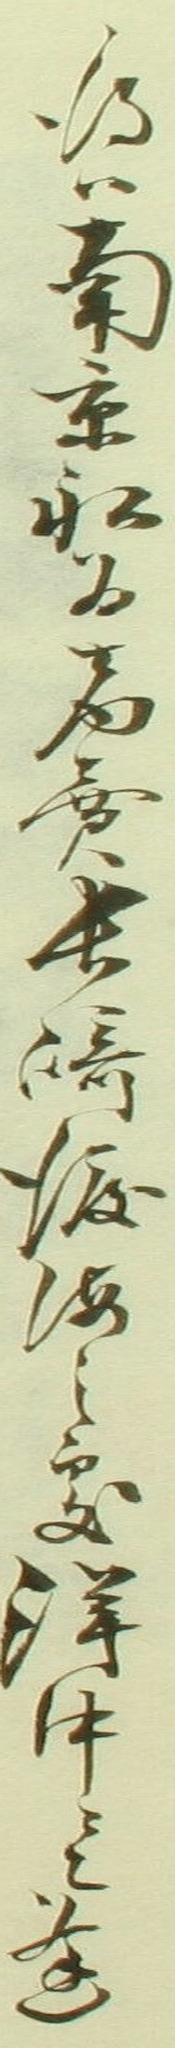候得は南京船為商売長崎渡海之処洋中にて逢
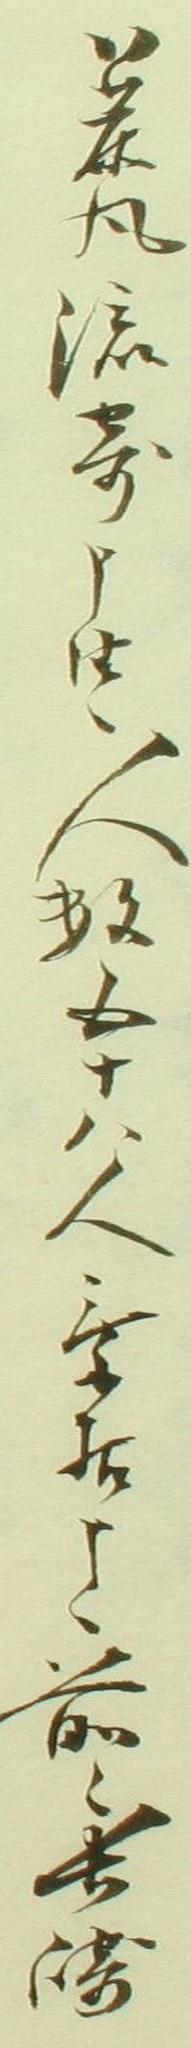暴風流寄申由候人数五十八人乗居申候前に長崎
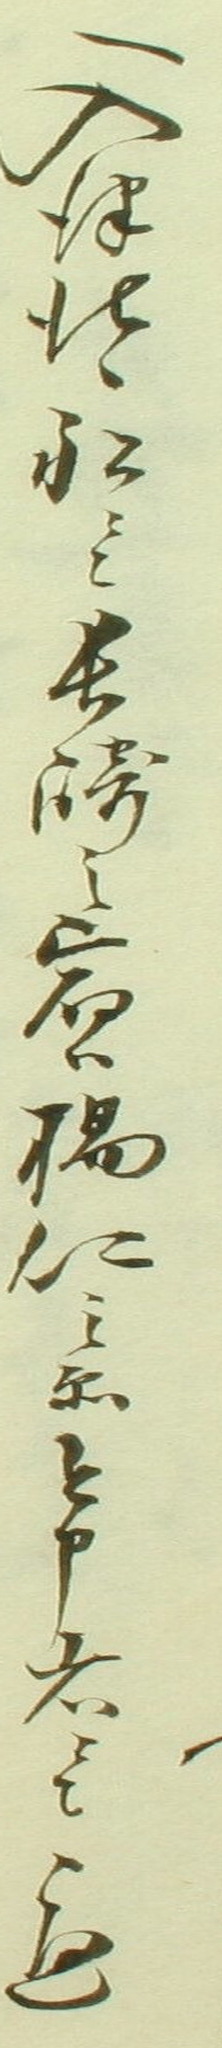へ入津仕候船にて長崎之宿は楊仁兵衛と申者にて候通
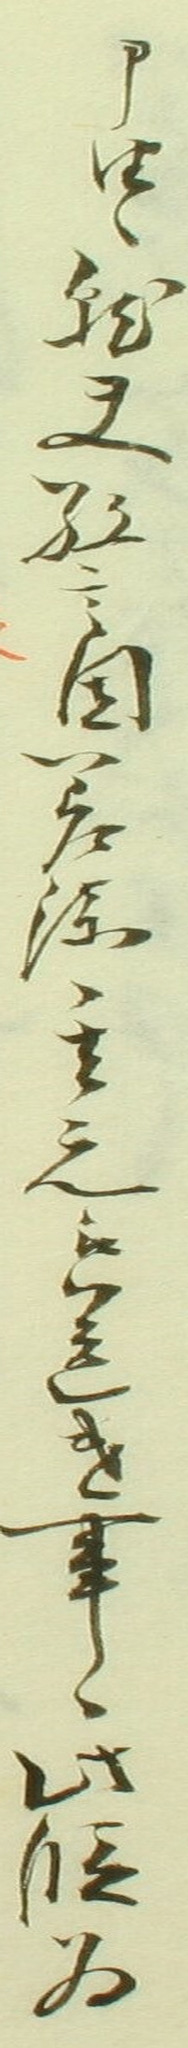申由候就夫警固差添其元え送遣事候此段為
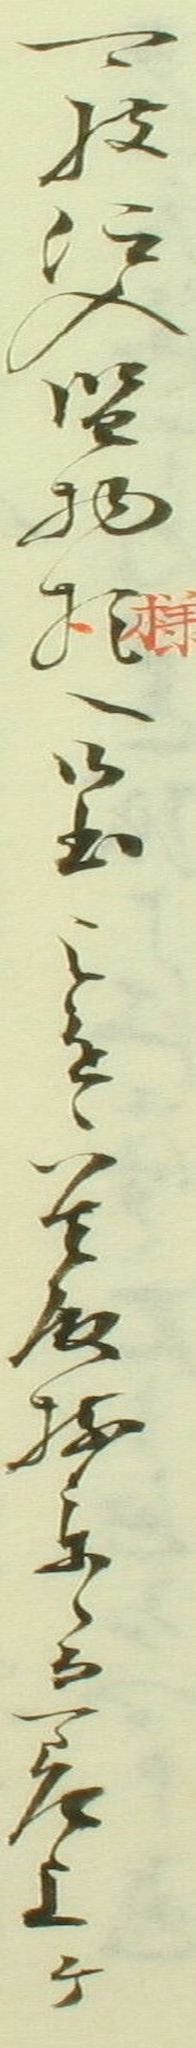可被仰入監物様へ御書被遣候貴殿持参候て差上ヶ
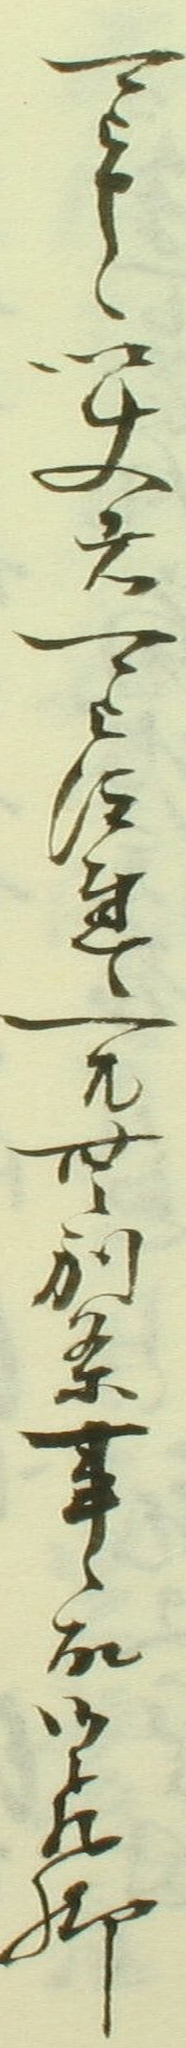可被申候以使者可被仰達候へ共無別条事候故御飛脚
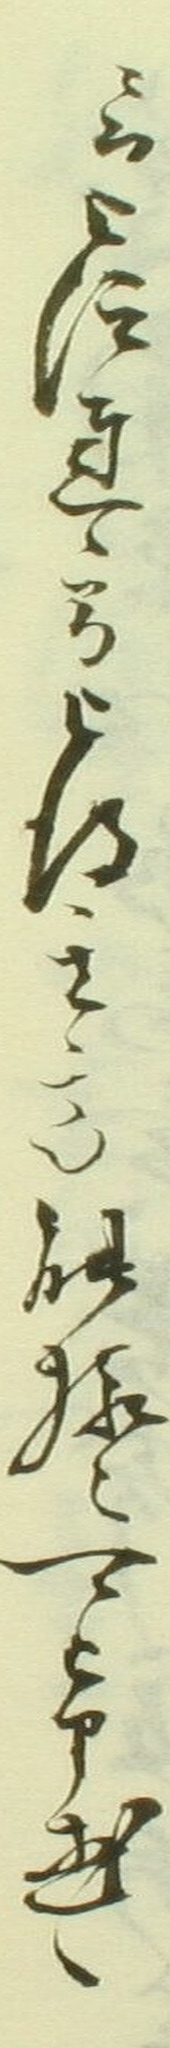にて被仰達候間被得其意能様に可被申述候
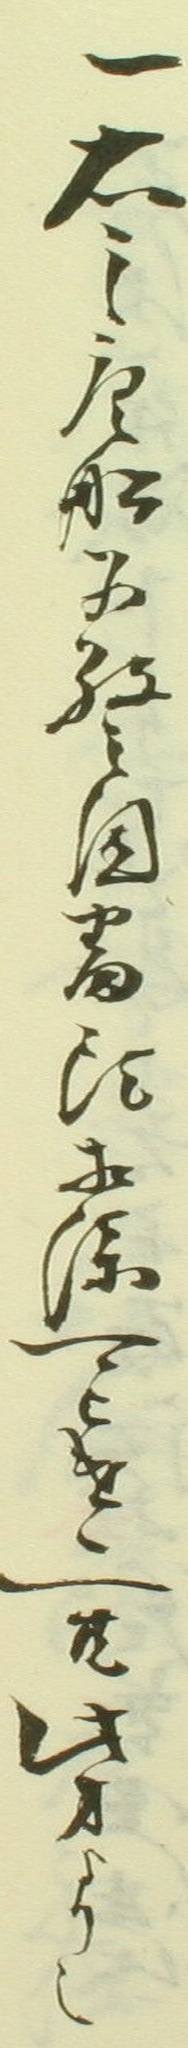一右之唐船為警固番頭相添可被遣候へ共此方より之
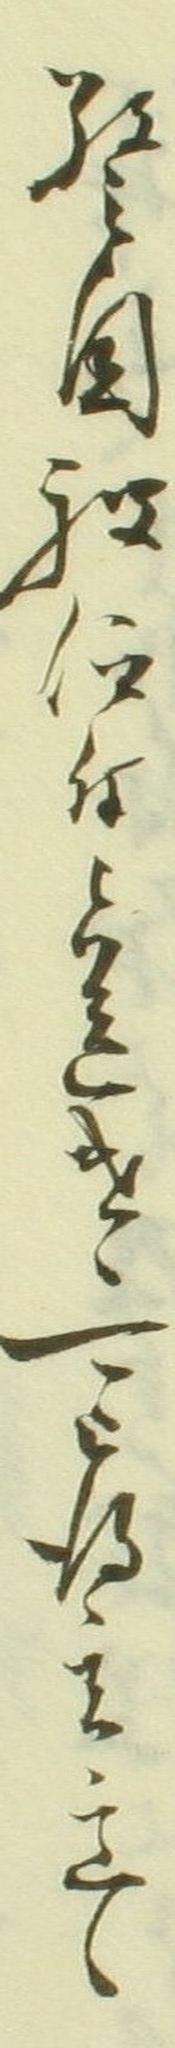警固被仰付被送遣候可被得其意候
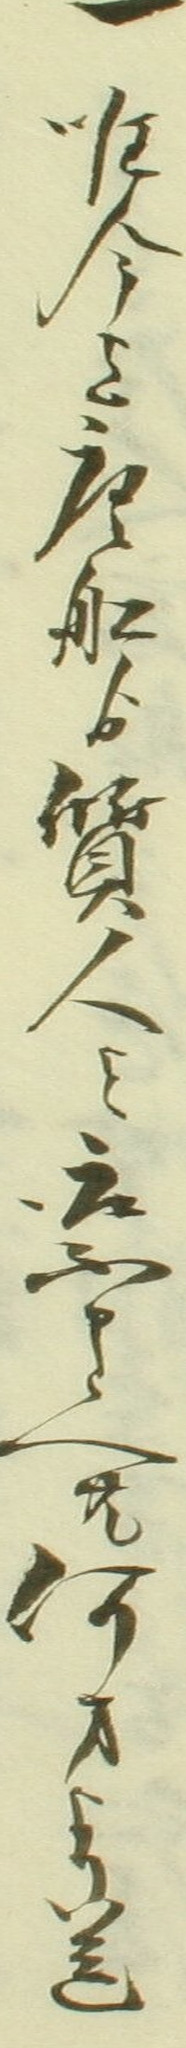一唯今迄唐船ゟ質人を取不申候へ共何方より送
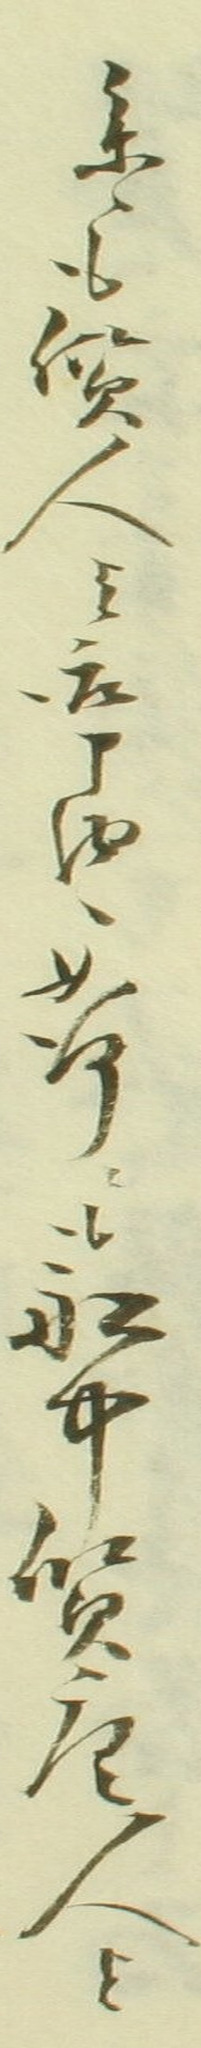参候も質人を取申由候如何にも船中質唐人を
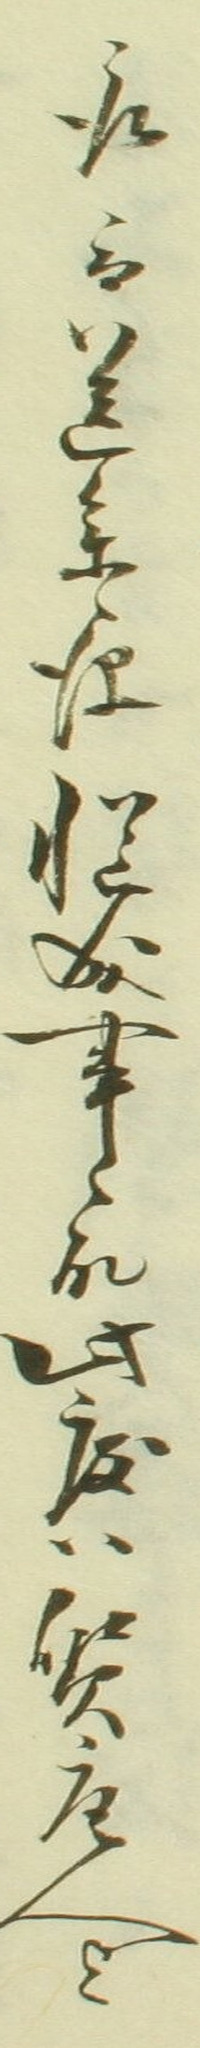取候て送参候儀慥成事候故此度は質唐人を
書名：異国船漂着記
